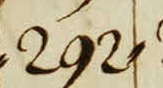292
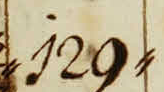129
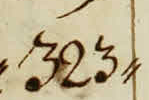323
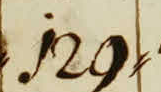129
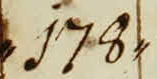178
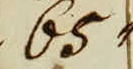65
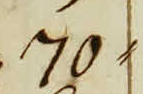70
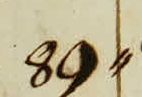89
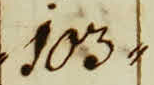103
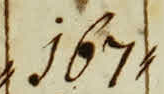167
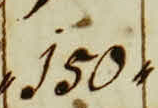150
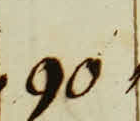90
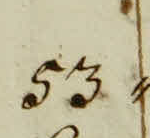53
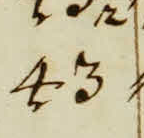43
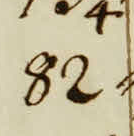82
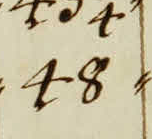48
